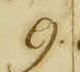9.
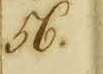56.
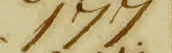177.
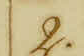2.
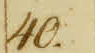40.
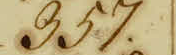357.
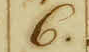6.
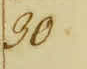30
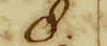8.
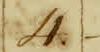4.
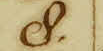8.
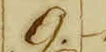9.
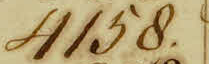4158.
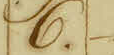6.
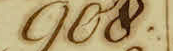908.
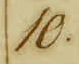10.
